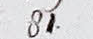81.
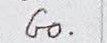60.
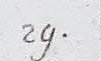29.
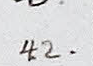42
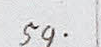59.
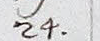24.
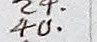40.
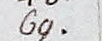69.
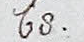68
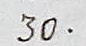30
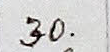30.
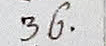36.
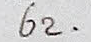62
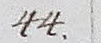44.
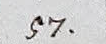57.
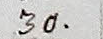30.
